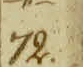72.
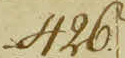426.
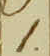1.
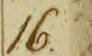16.
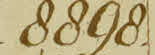8898.
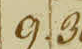9.
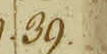39.
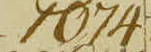1074
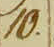10.
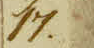17.
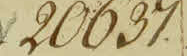20637.
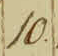10.
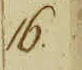16.
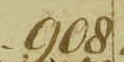908.
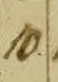10.
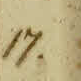17.
